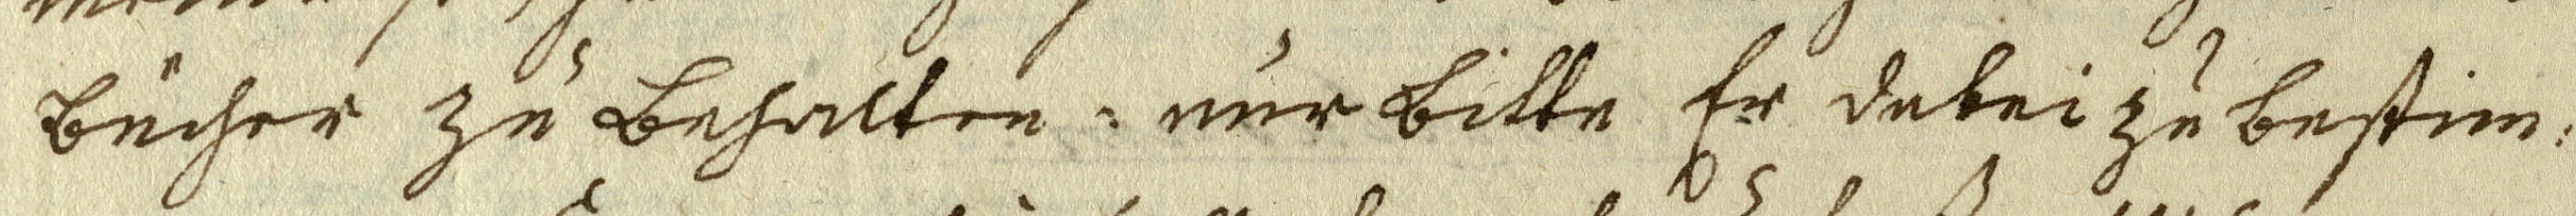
Bücher zu behalten, nur bitte Er dabei zu bestim¬
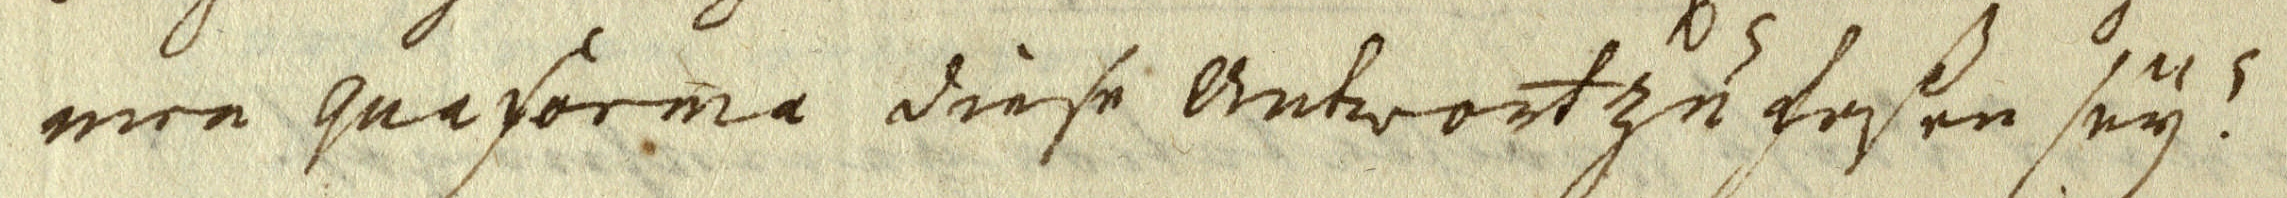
men qua forma diese Antwort zu faßen seÿ!
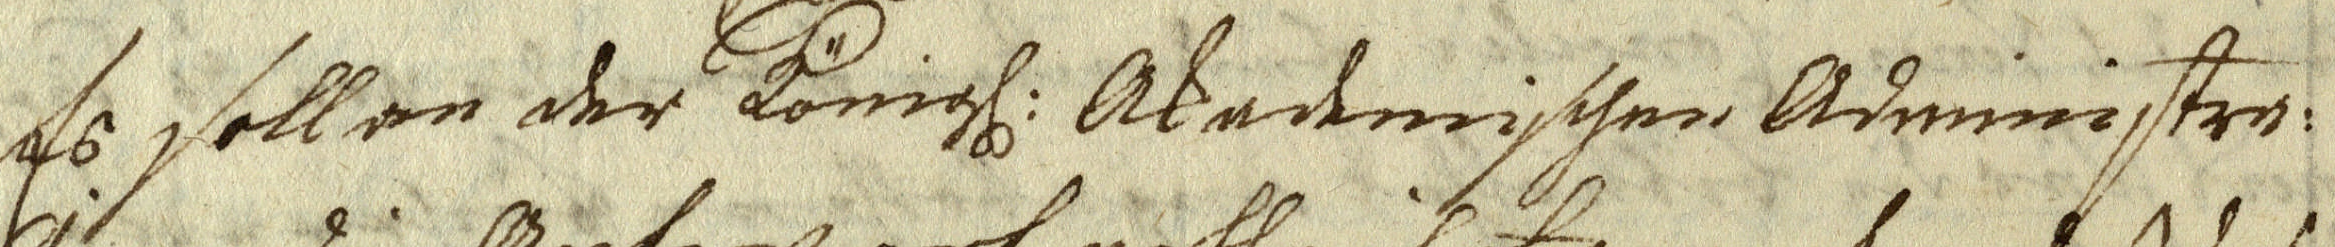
Es soll an der Königl: Akademischen Administra¬
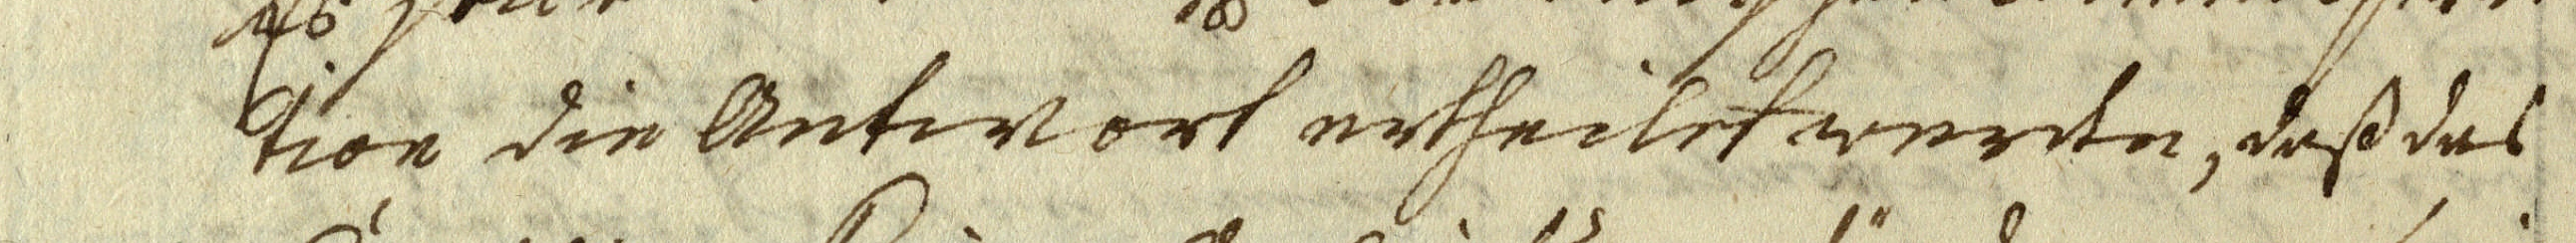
tion die Antwort ertheilet werden, daß das
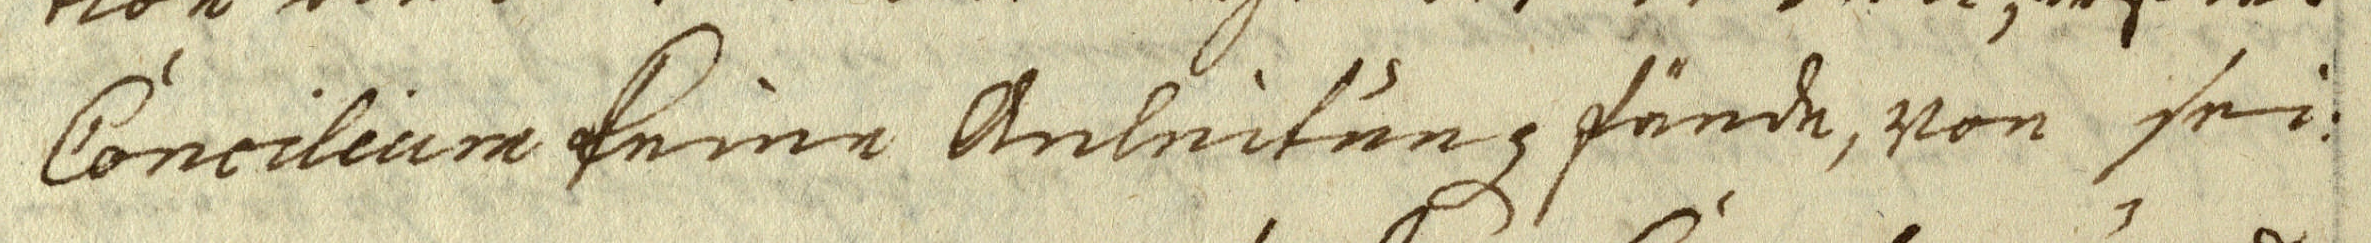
Concilium keine Anleitung fände, von sei¬
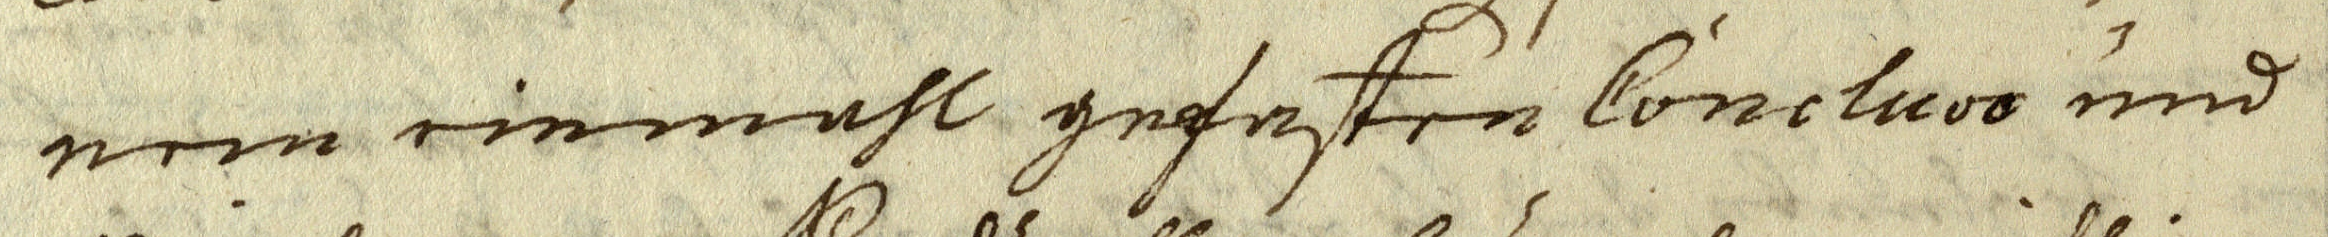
nem einmahl gefasten Concluso und
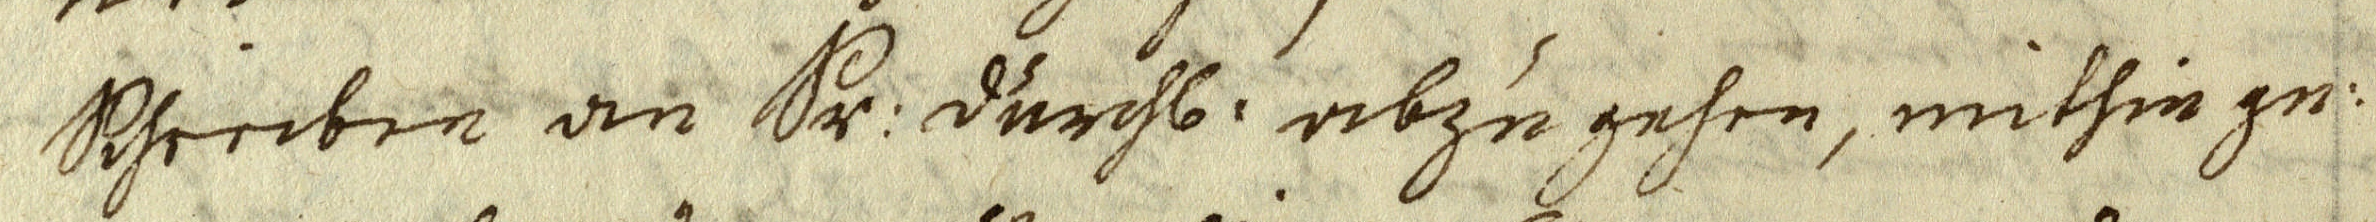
Schreiben an Sr Durchl abzugehen, mithin ge¬
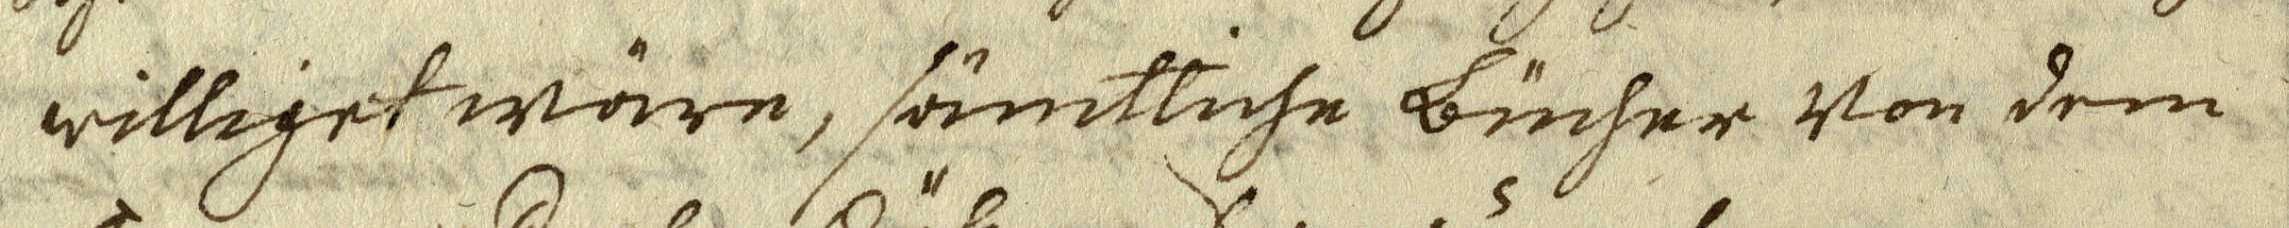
williget wäre, sämtliche Bücher von dem
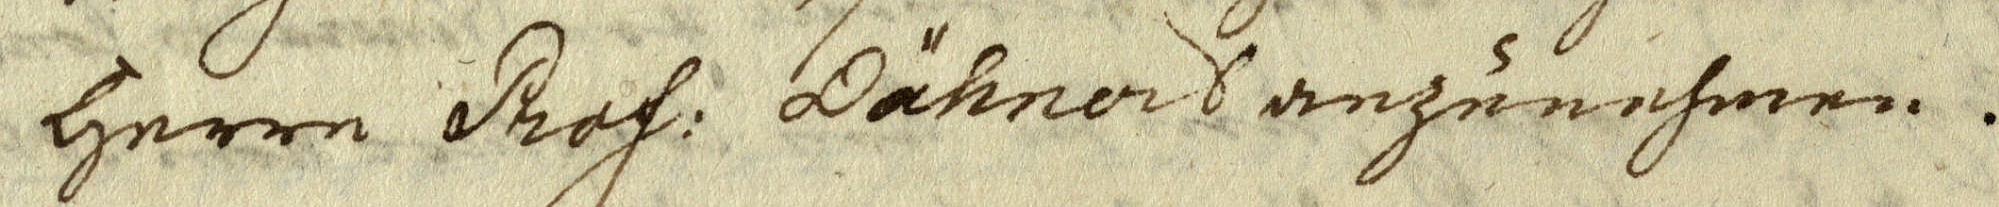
Herrn Prof: Dähnert anzunehmen.
